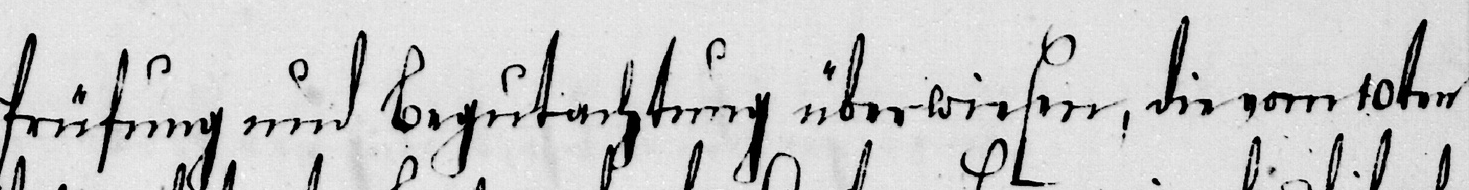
Prüfung und Begutachtung überwiesen, die vom 10ten
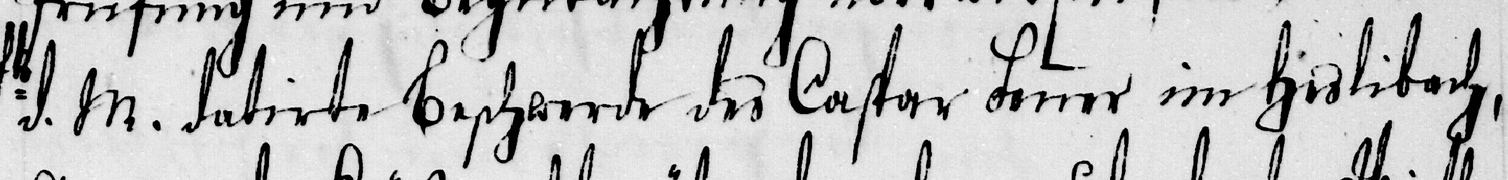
d. M. datirte Beschwerde des Caspar Fenner im Heslibach,
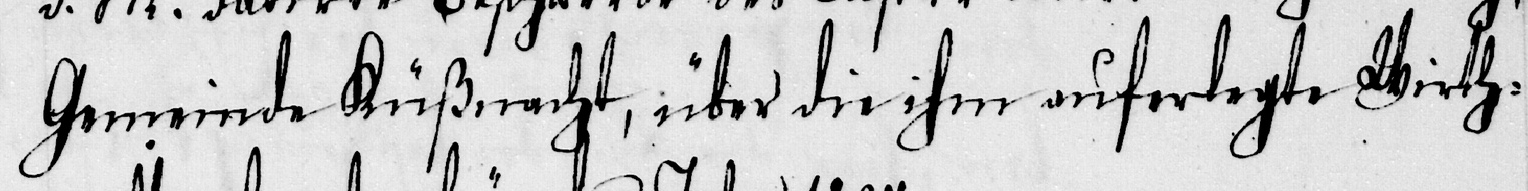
Gemeinde Küßnacht, über die ihm auferlegte Wirth¬
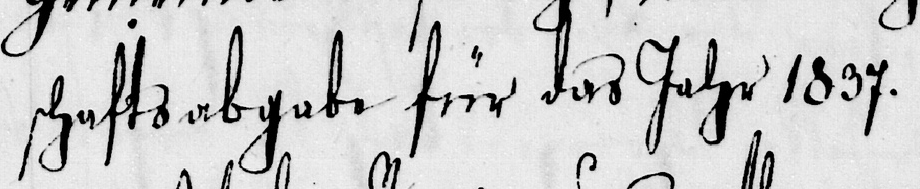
schaftsabgabe für das Jahr 1837.
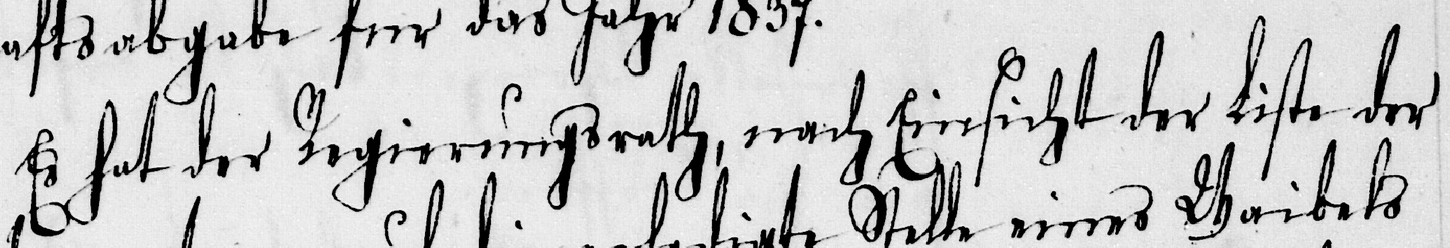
Es hat der Regierungsrath, nach Einsicht der Liste der
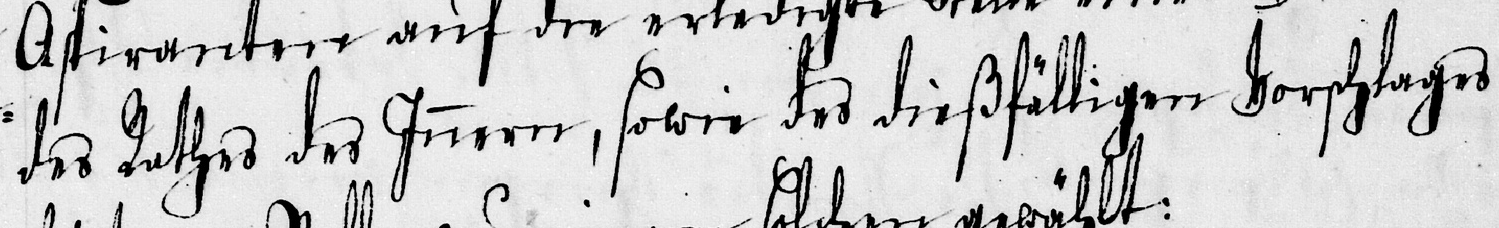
des Rathes des Innern, sowie dießfälligen Vorschlages
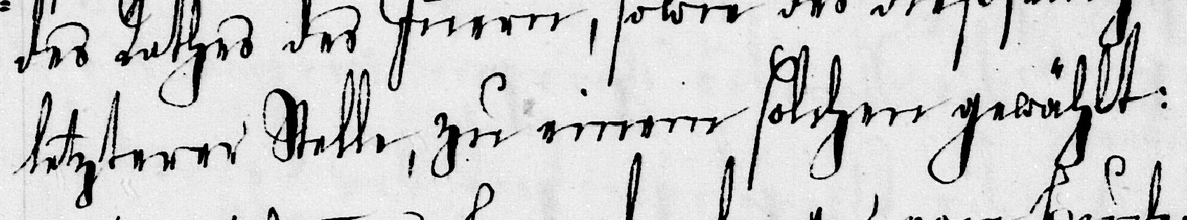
letzterer Stelle, zu einem solchen gewählt:
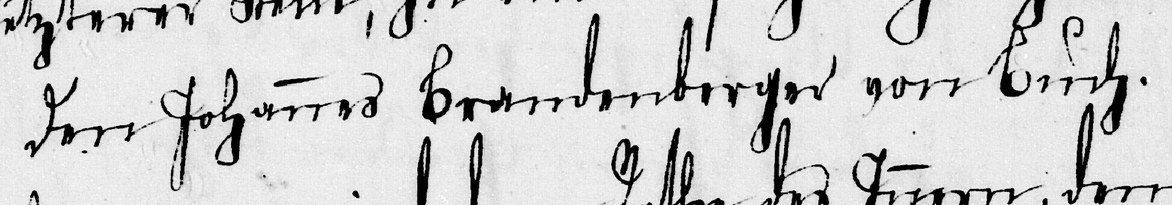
Den Johannes Brandenberger von Buch.
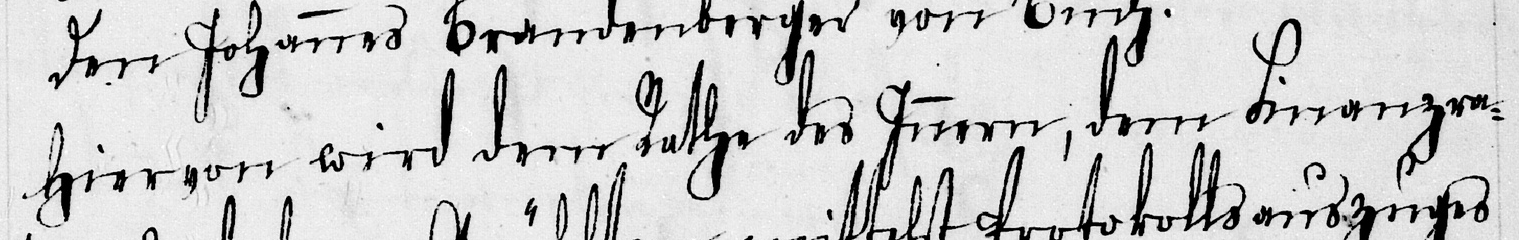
Hiervon wird dem Rathe des Innern, dem Finanzra¬
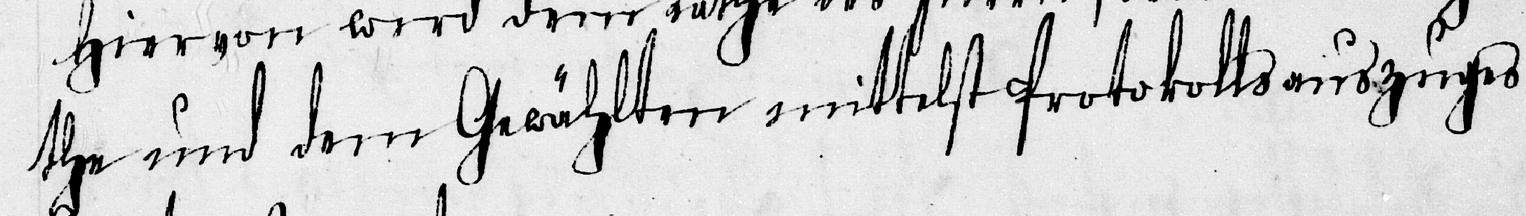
the und dem Gewählten mittelst Protokollsauszuges
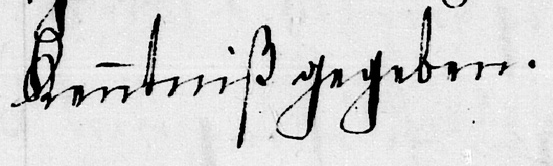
Kenntniß gegeben.
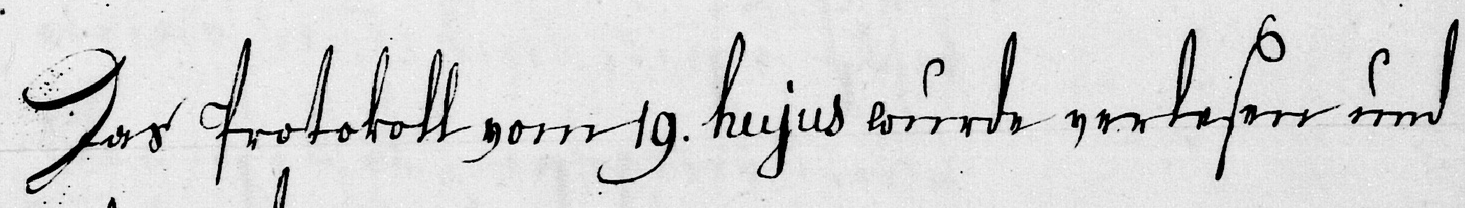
Das Protokoll vom 19. hujus wurde verlesen und
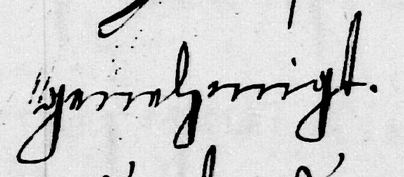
genehmigt.
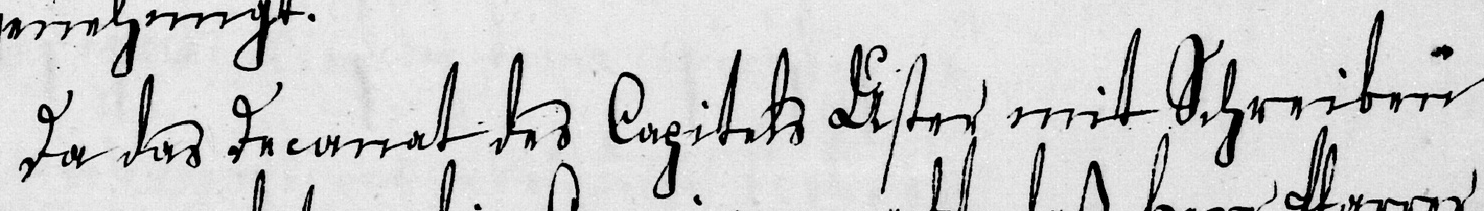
Da das Decanat des Capitels Uster mit Schreiben
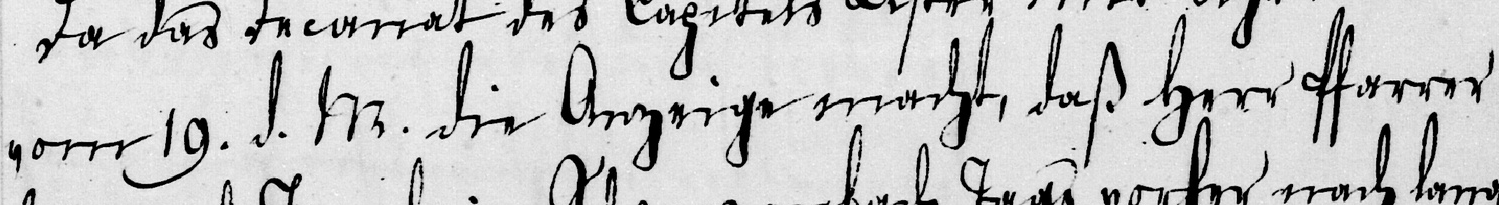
vom 19. d. M. die Anzeige macht, daß Herr Pfarrer
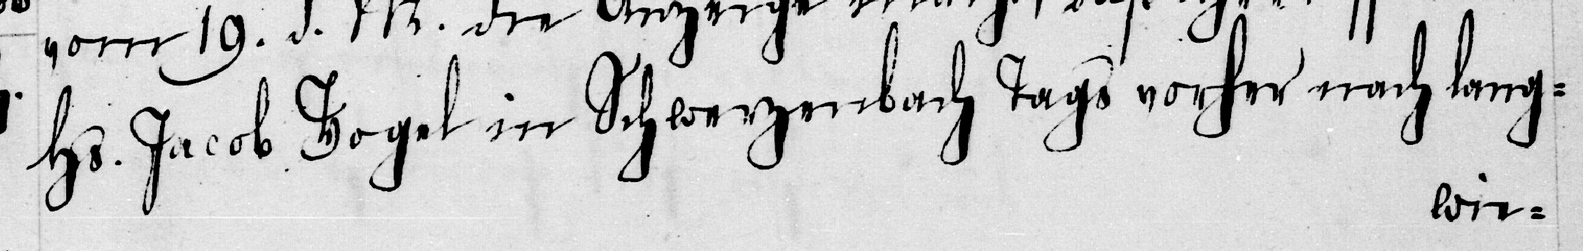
Hs. Jacob Vogel in Schwerzenbach Tags vorher nach lang-
